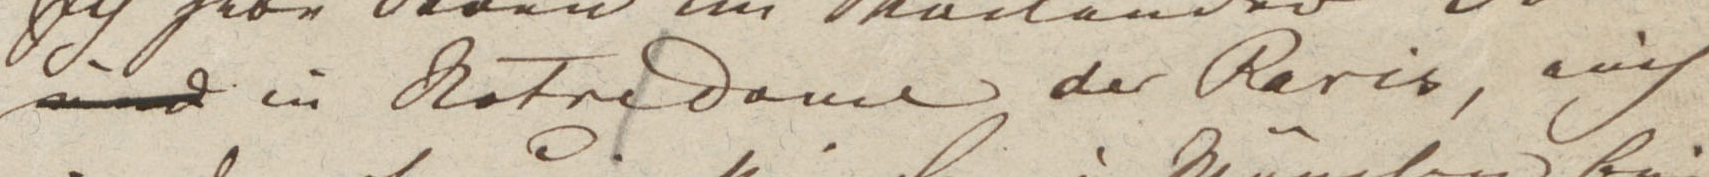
und in Notre %Dame de Paris, auch
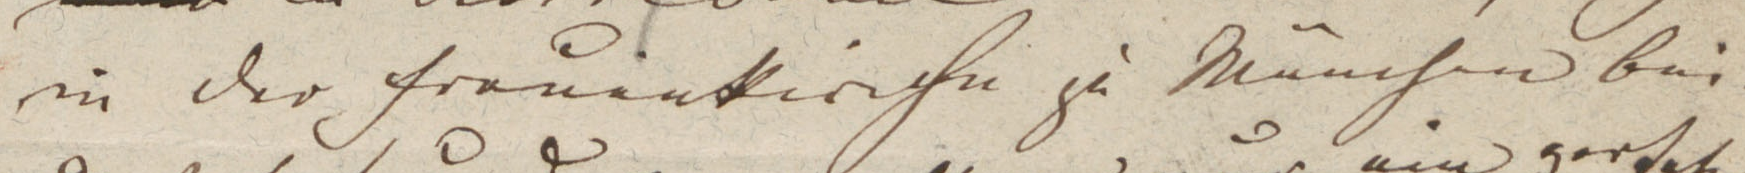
in der Frauenkirche zu München bei-
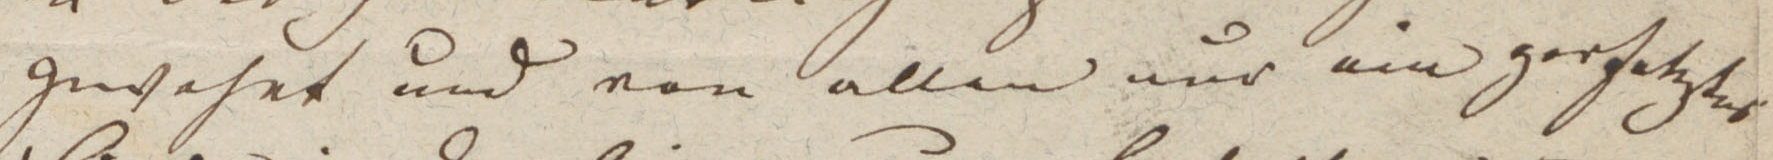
gewohnt und von allen nur ein zerfetztes
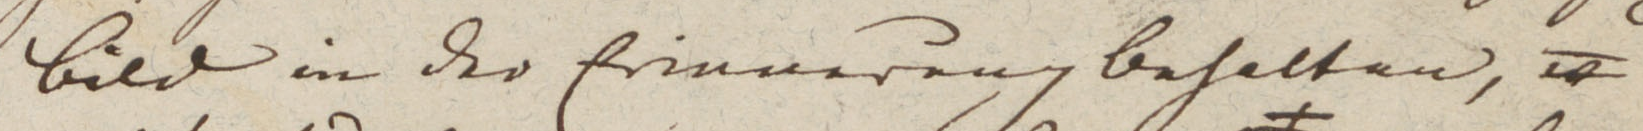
Bild in der Erinnerung behalten, w
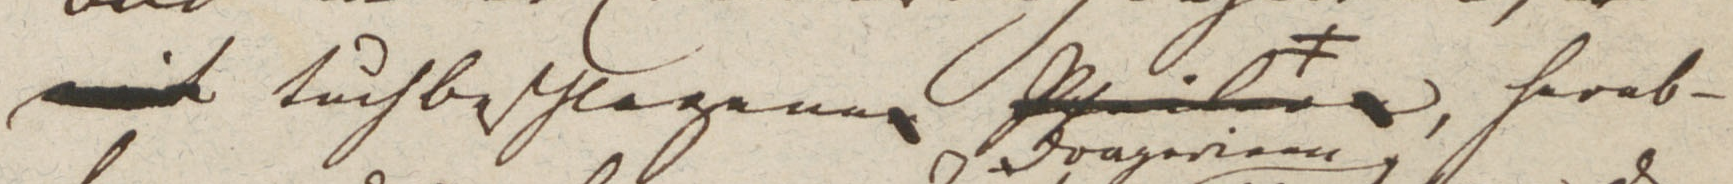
mit tuchbeschlagenen Pfeilern%, herab-
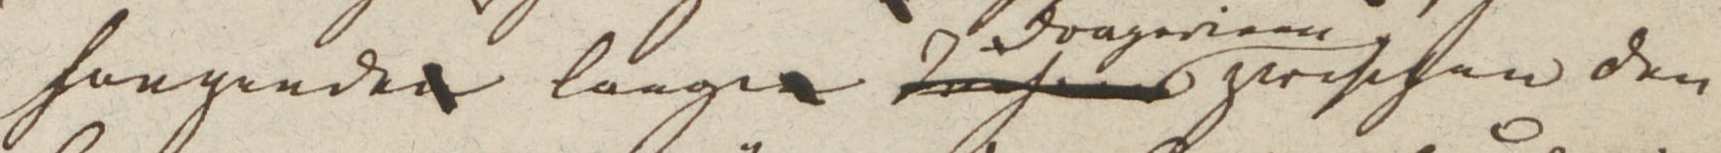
hangenden langen Tüchern Darperieen zwischen den
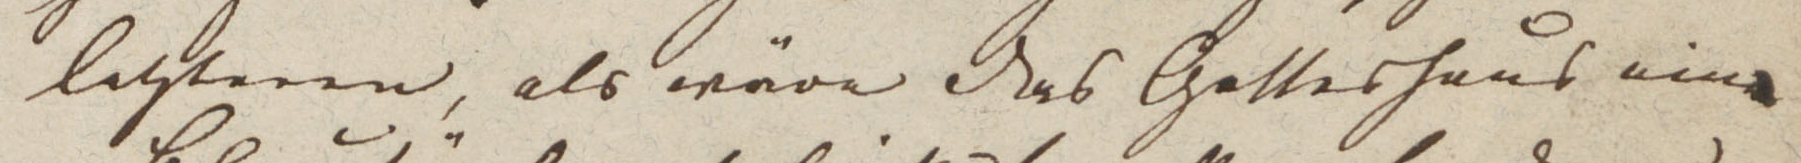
letzteren, als wäre das Gotteshaus eine
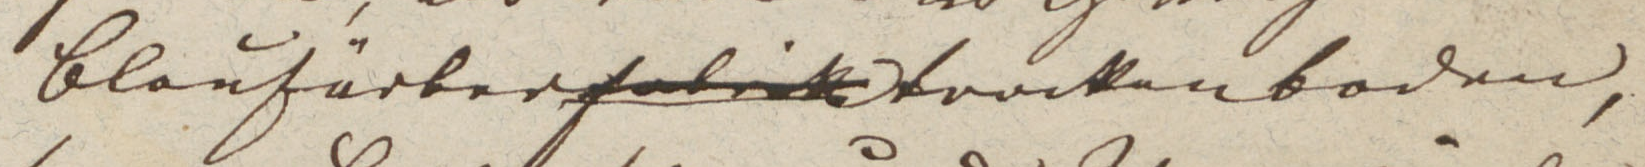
Blaufärberfabriktrockenboden,
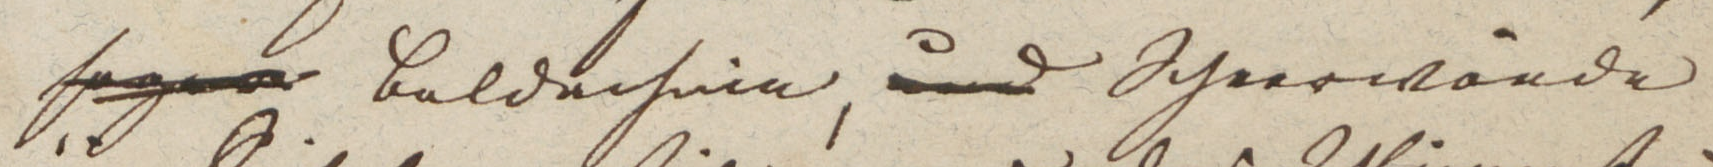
sogar Baldachine, und Scheerwände
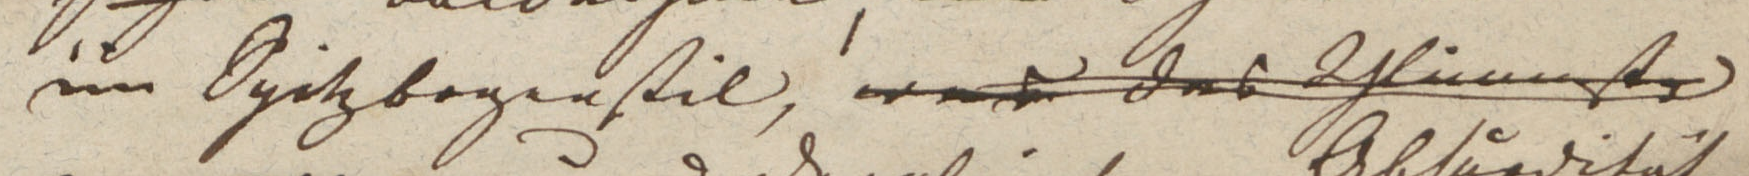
im Spitzbogenstil, was das Schlimmste
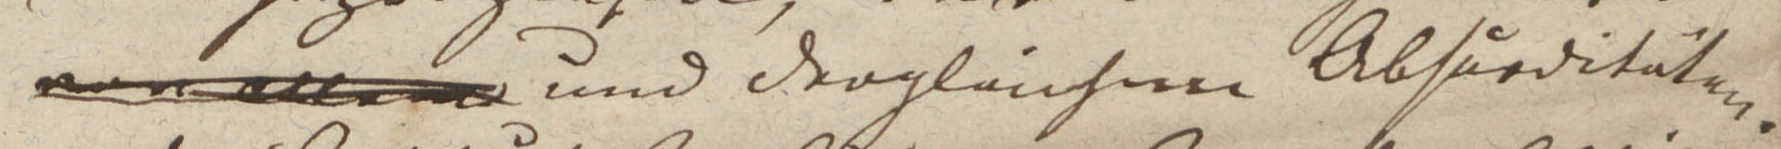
von allem und dergleichen Absurditäten.
